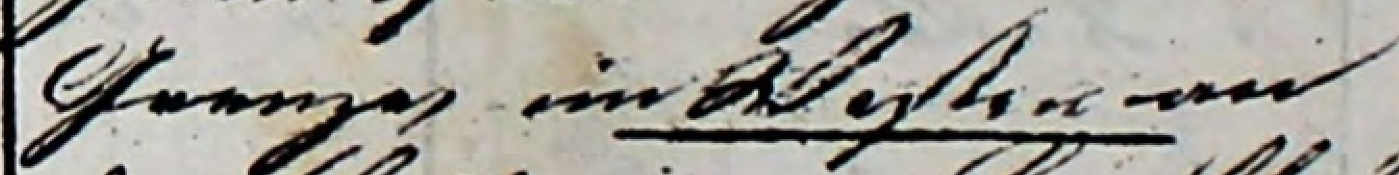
Grenze, im Wester an
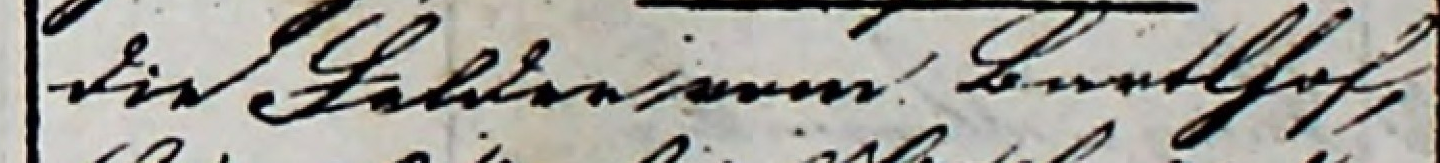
die Felder vom Bartlhof,
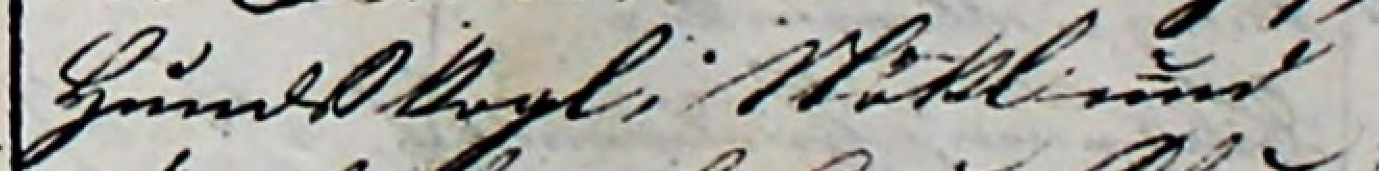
Hundskogl, Nökl und
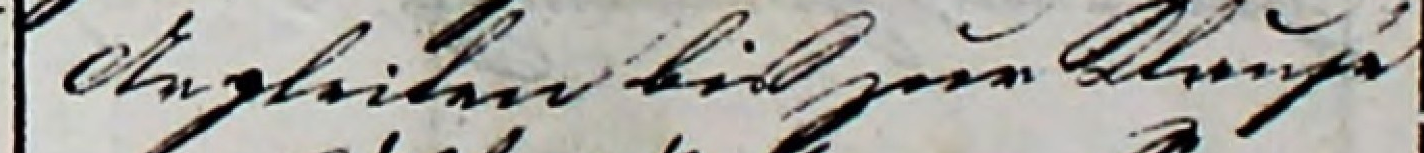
Argleiten bis zum Klause
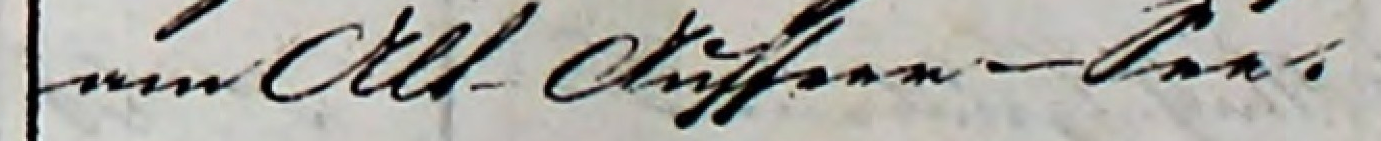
am Alt-Ausseer–See.
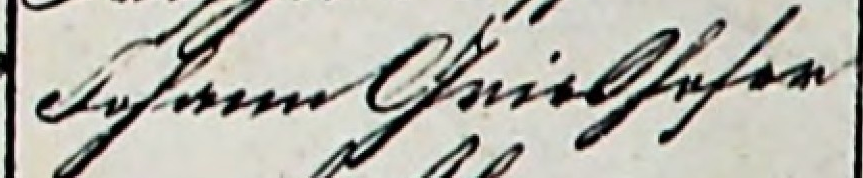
Johann Grieshofer
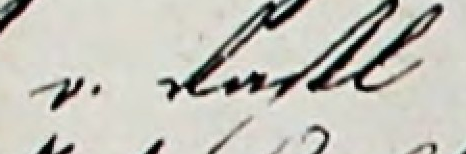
v. Dastl
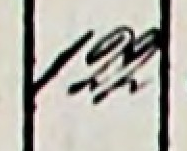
122
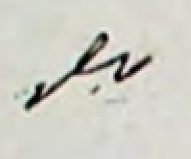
do
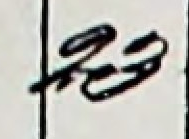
23
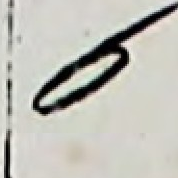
6
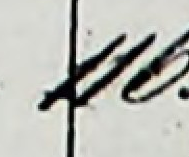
116
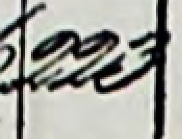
223
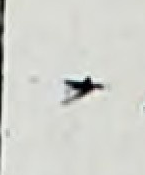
„
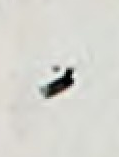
„
